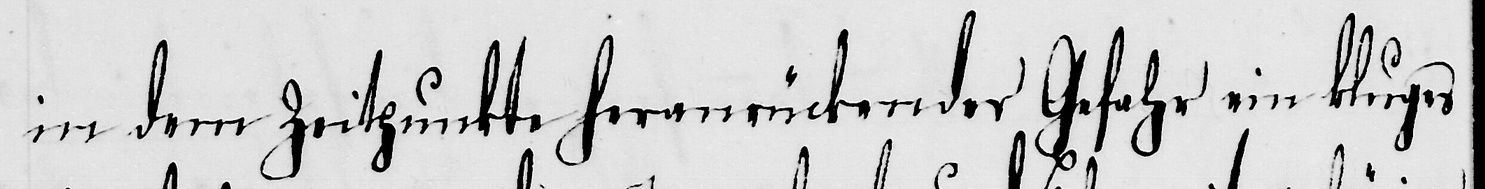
in dem Zeitpunkte heranrückender Gefahr ein kluges
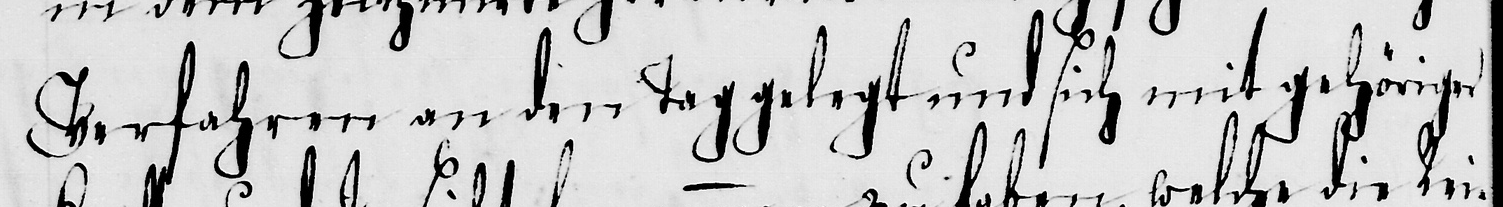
Verfahren an den Tag gelegt und sich mit gehöriger
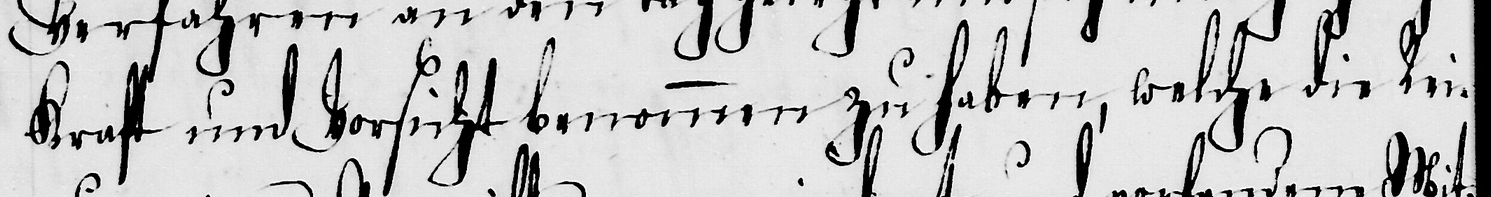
Kraft und Vorsicht benommen zu haben, welche die Re¬
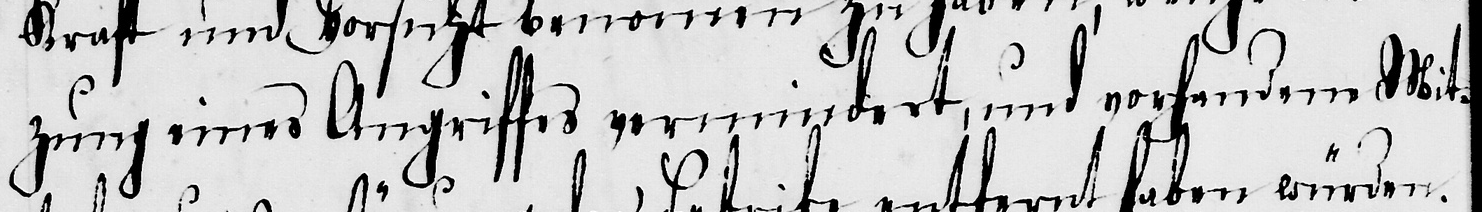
izung eines Angriffes vermindert, und vorhandene Mit¬
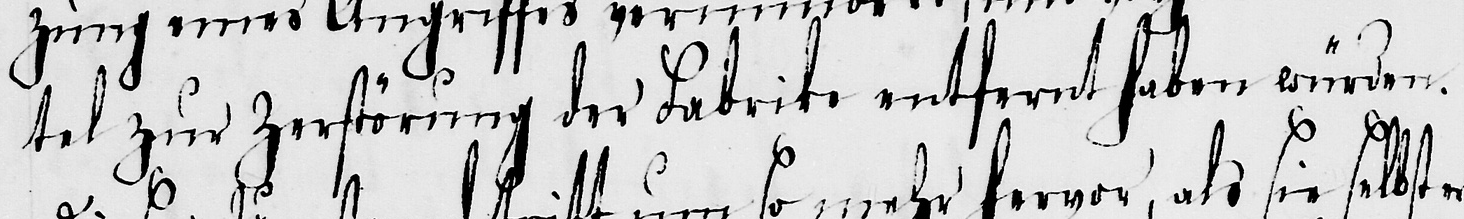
tel zur Zerstörung der Fabrik entfernt haben würden.
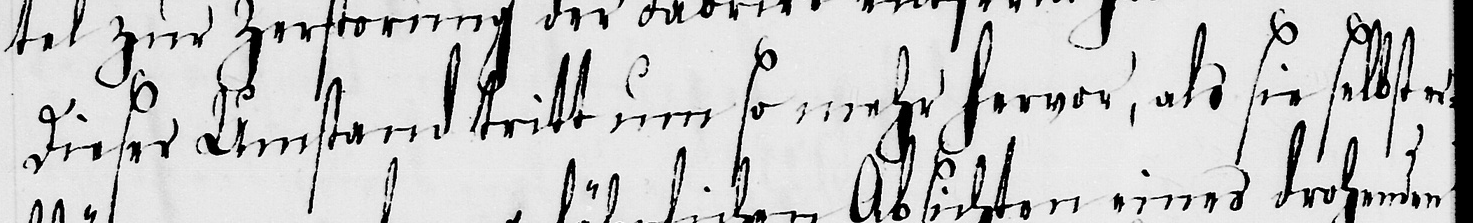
Dieser Umstand tritt um so mehr hervor, als sie selbst
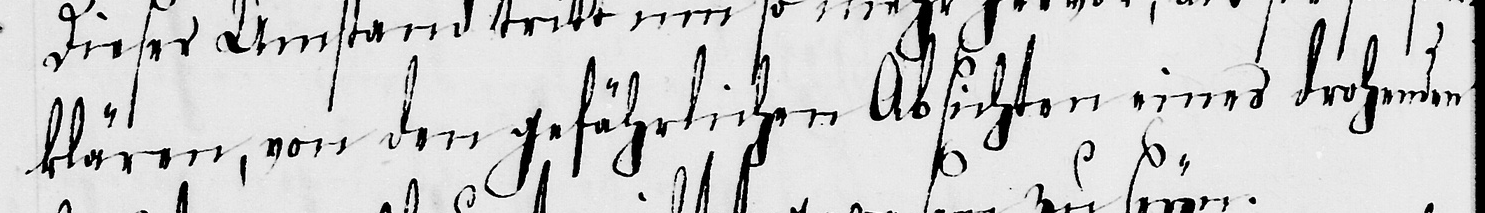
klären, von den gefährlichen Absichten eines drohenden
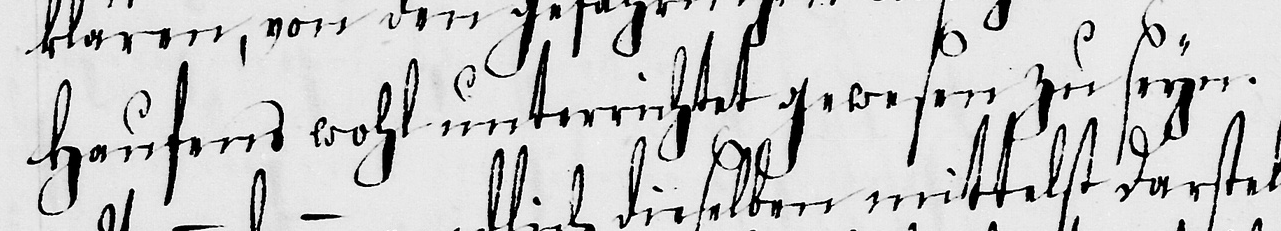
Haufens wohl unterrichtet gewesen zu seyn.
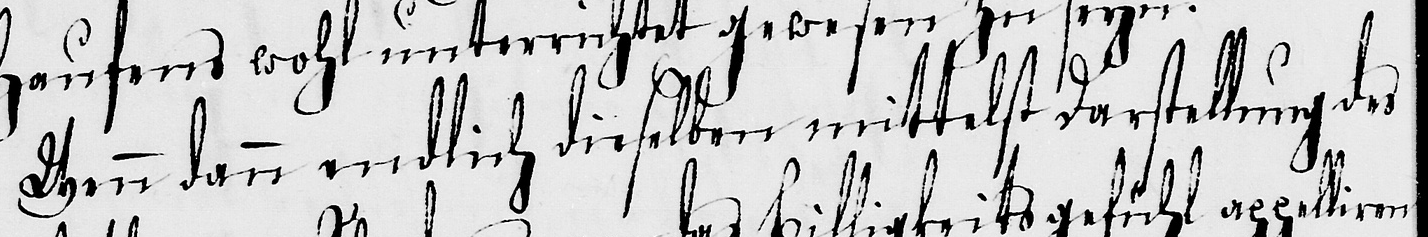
Wenn dann endlich dieselben mittelst Darstellung d¬
